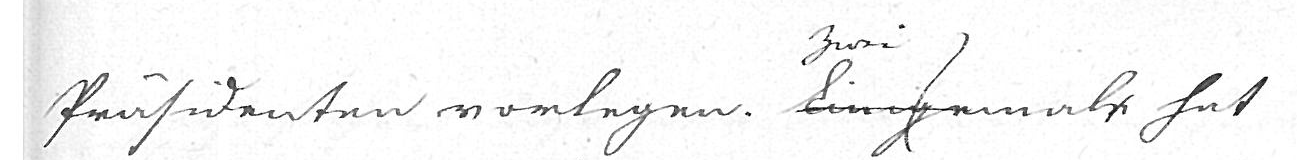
Präsidenten vorlegen. Zweimal hat
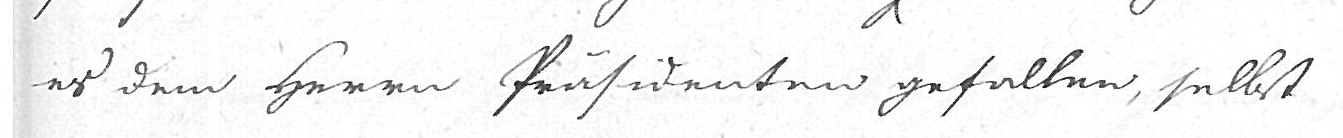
es dem Herrn Präsidenten gefallen, welbst
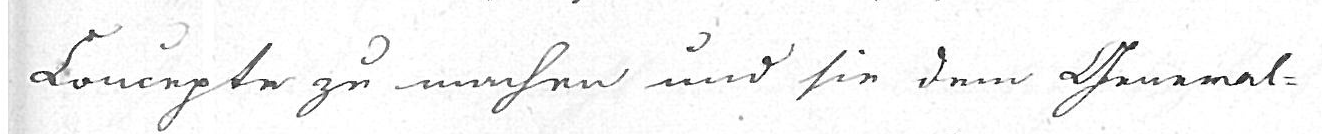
Concepte zu machen, und sie dem General-
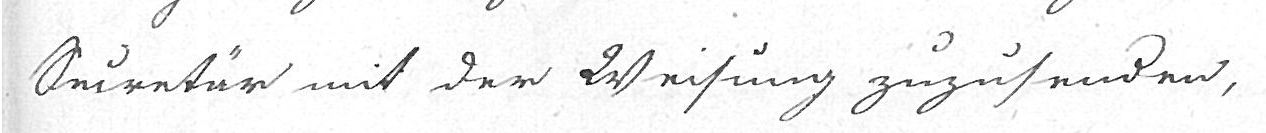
Secretär mit der Weisung zuzusenden,
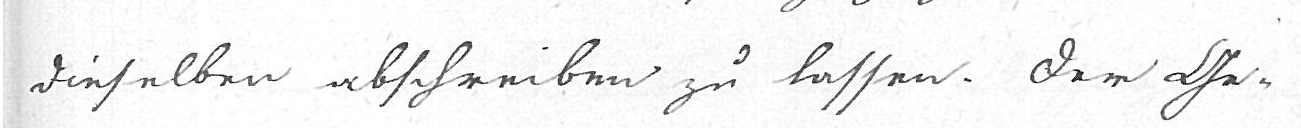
dieselbe abschreiben zu lassen. Der Ge-
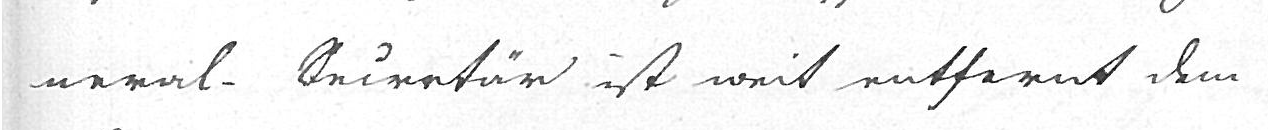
neral-Secretär ist weit entfernt dem
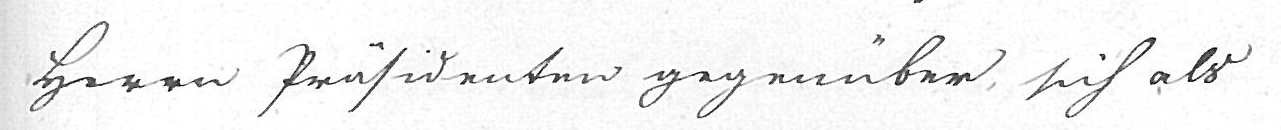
Herrn Präsidenten gegenüber sich als
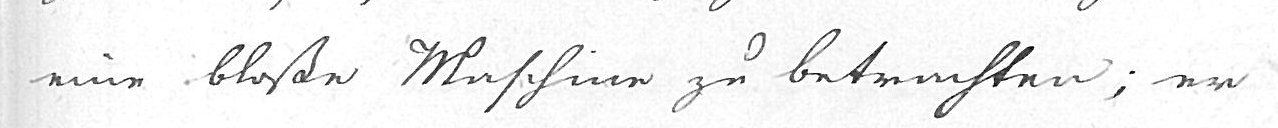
eine bloße Maschine zu betrachten; er
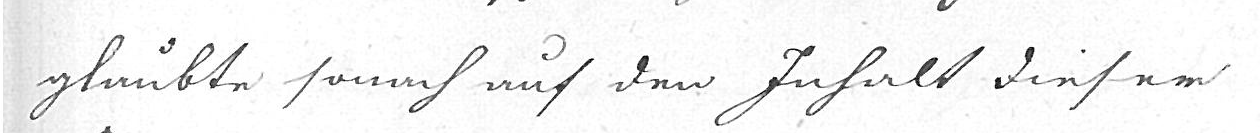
glaubte sonach auf den Inhalt dieser
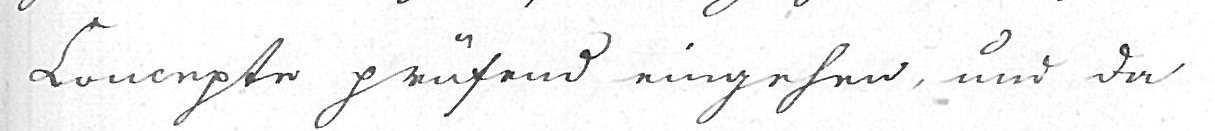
Concepte prüfend eingehen, und da
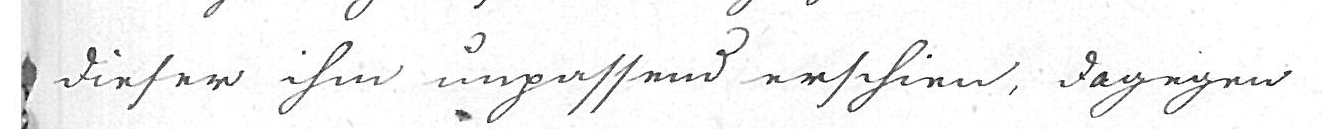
dieser ihm unpassend erschien, dagegen
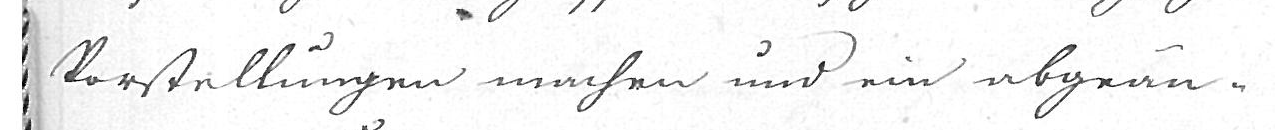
Vorstellungen mach und ein abgeän-
